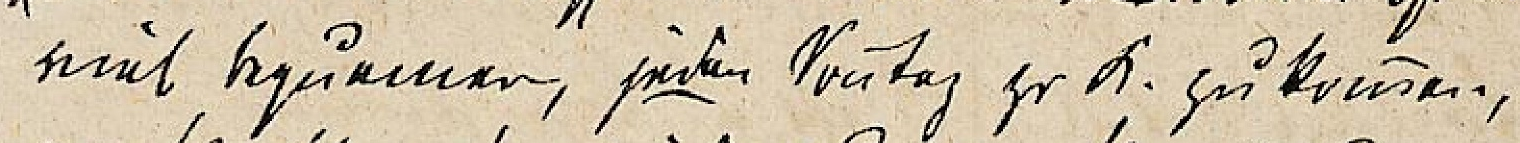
viel bequemer, jeden Sontag zr K. zu komen,
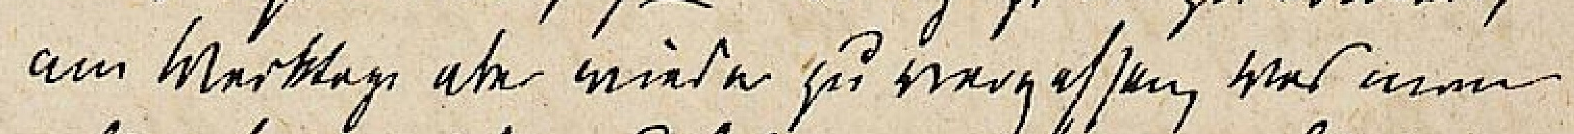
am Werktage aber wieder zu vergessen, was man
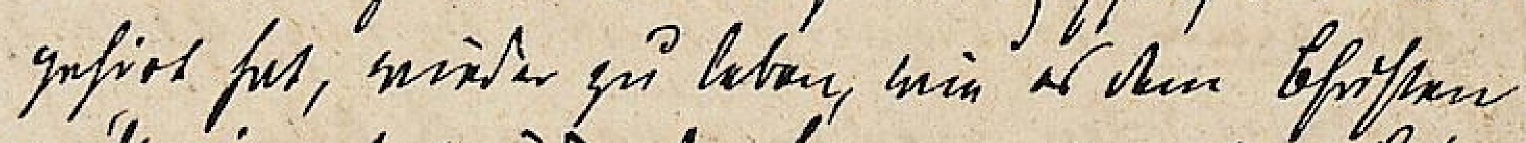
gehört hat, wieder zu leben, wie es dem Christen
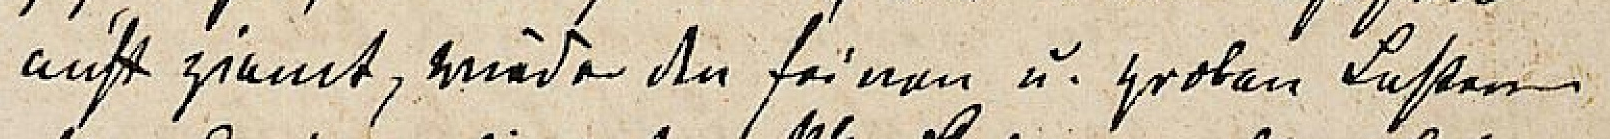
nicht ziemt, wieder da feinen u. groben Lasten
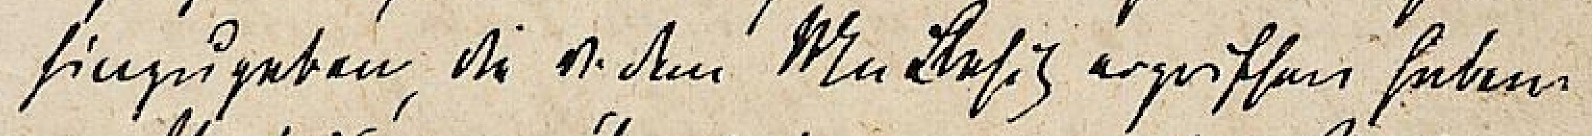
hinzugeben, die v. dem Mn Besitz ergriffen haben.
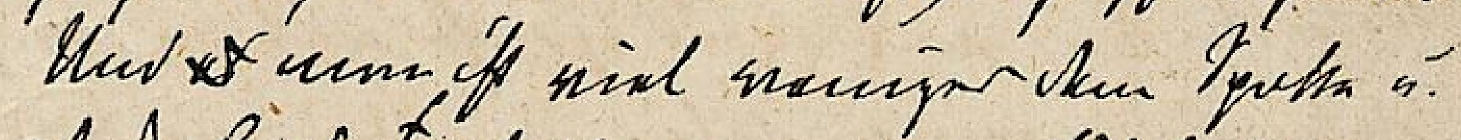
Und es man ist viel weniger dem Spotte u.
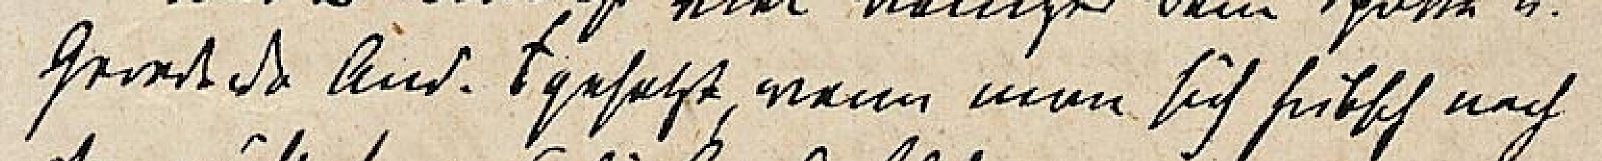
Gerede And. sgesetzt, wenn man sich hübsch nach
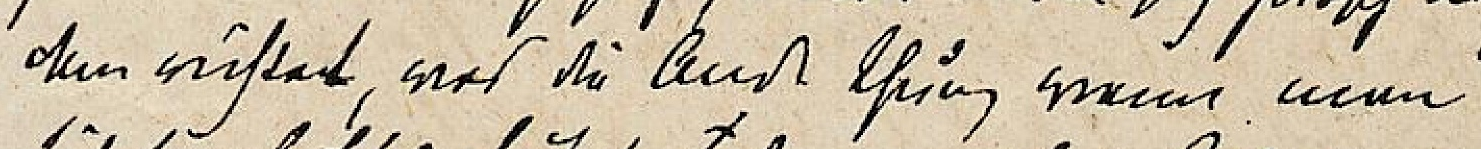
dem richtet, was die And. thun, wenn man
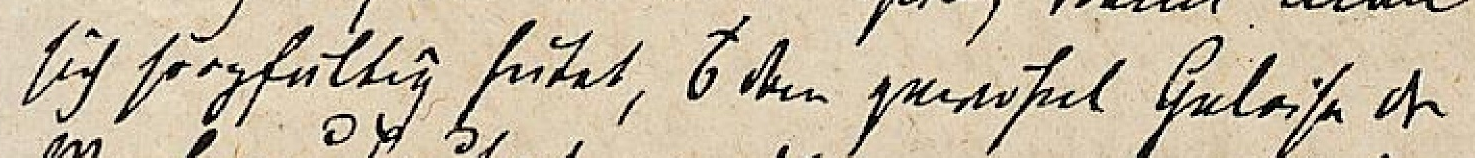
sich sorgfältig hütet, s dem gewöhnl. Geleis dr
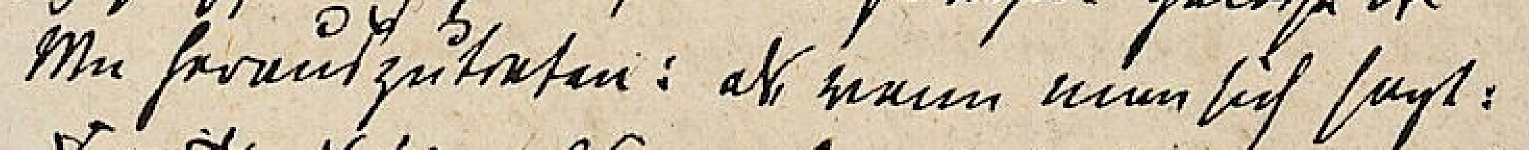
Mn herauszutreten: als wenn man sich sagt:
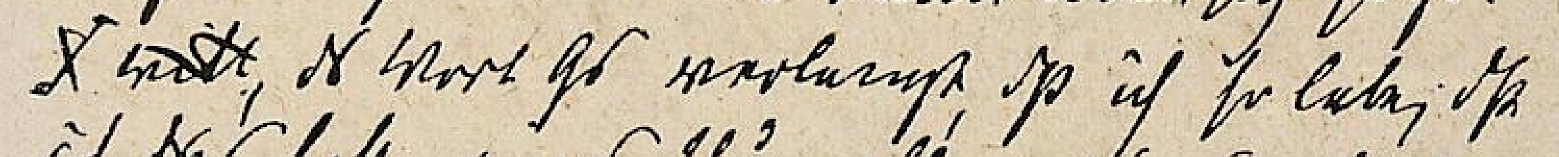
Χ will, das Wort Gs verlangt, dß ich so lebe, dß
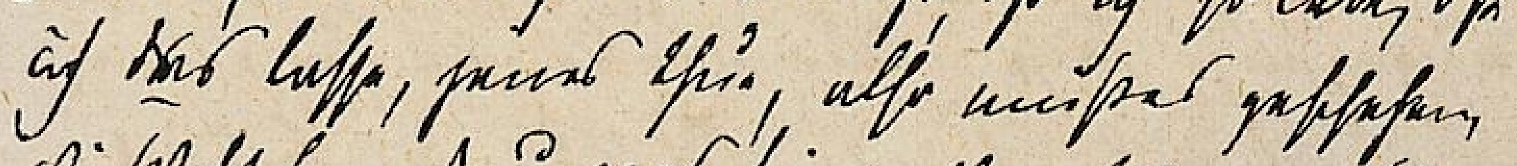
ich das Lasse, jenes thue, also muß es geschehen,
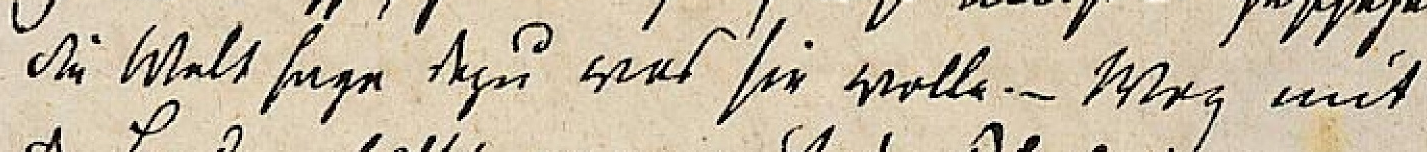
die Welt sage dazu was sie wolle.: Weg mit
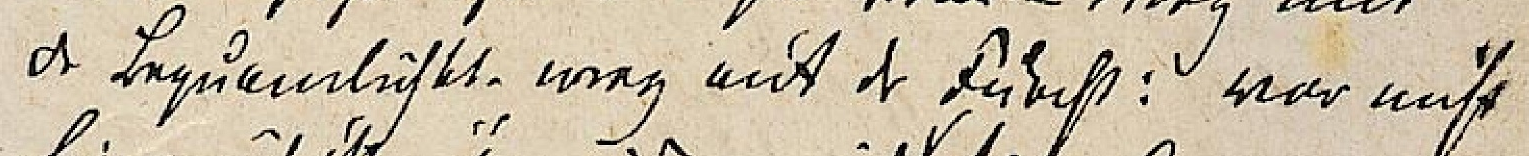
dr Bequemlichkt. weg mit dr Furcht: wer nicht
